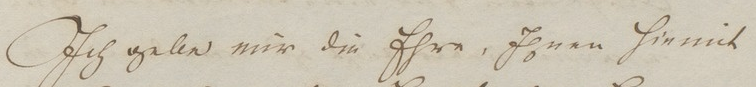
Ich gebe mir die Ehre, Ihnen hiemit
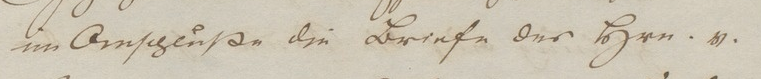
im Anschluße die Briefe des Hrn. v.
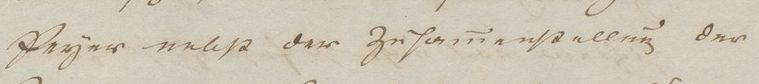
Peyer nebst der Zusammenstellung der
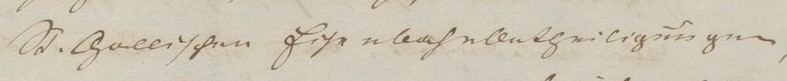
St. Gallischen Eisenbahnbetheiligungen,
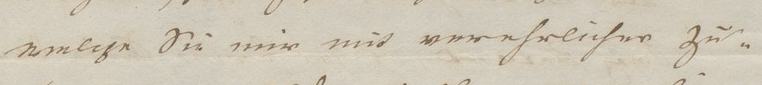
welche Sie mir mit verehrlicher Zu-
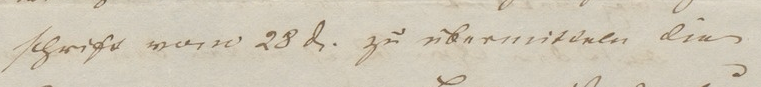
schrift vom 28.d. zu übermitteln die
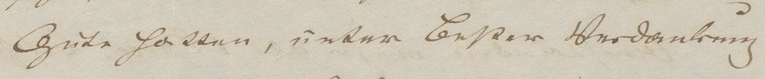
Güte hatten, unter bester Verdankung
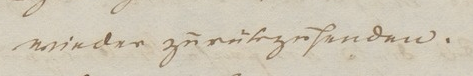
wieder zurükzusenden. –
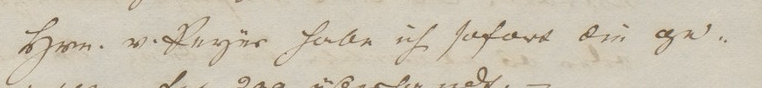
Hrn. v. Peyer habe ich sofort die ge-
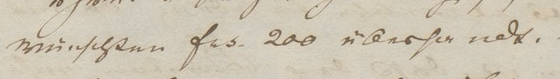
wünschten frs. 200 übersandt. –
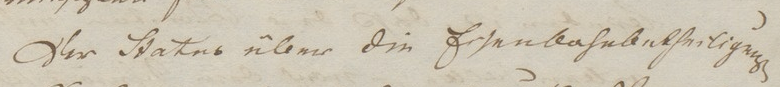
Der Status über die Eisenbahnbetheiligungen
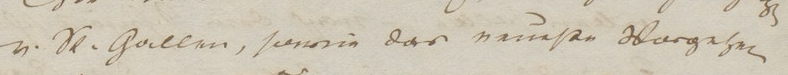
v. St. Gallen, sowie das neueste Vorgehen
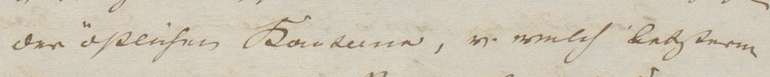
der östlichen Kantone, v. welch letzterm
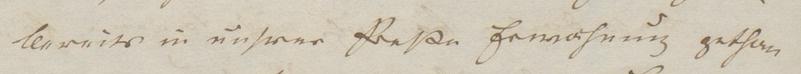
bereits in unsrer Preße Erwähnung gethan
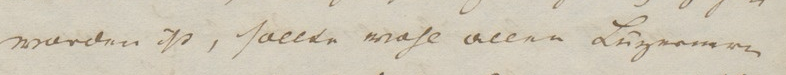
worden ist, sollte wohl allen Luzernern
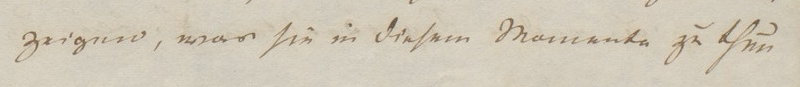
zeigen, was sie in diesem Momente zu thun
